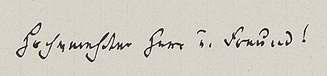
Hochverehrter Herr u. Freund!
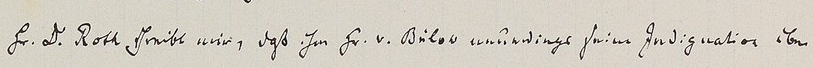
Hr. DrRoth schreibt mir, daß ihm Hr. v. Bülow neuerdings seine Indignation über
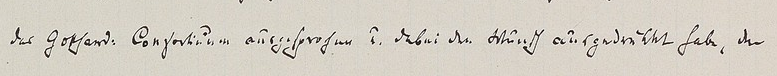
das Gotthard-Consortium ausgesprochen u. dabei den Wunsch ausgedrükkt habe, der
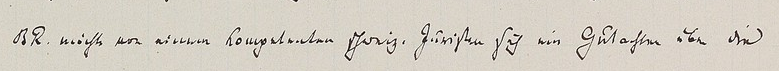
BR. möchte von einem kompetenten schweiz. Juristen sich ein Gutachten über die
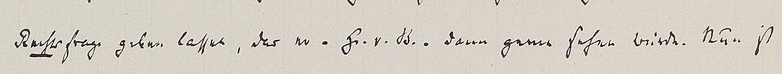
Rechtsfrage geben lassen, das er – Hr. v. B. – dann gerne sehen würde. Nun ist
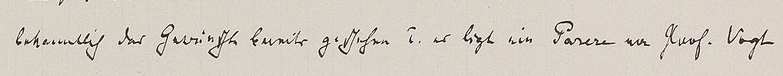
bekanntlich das Gewünschte bereits geschehen u. es ligt ein Parere von Prof. Vogt
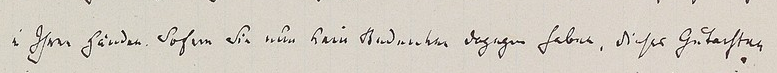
in Ihren Händen. Sofern Sie nun kein Bedenken dagegen haben, dieses Gutachten
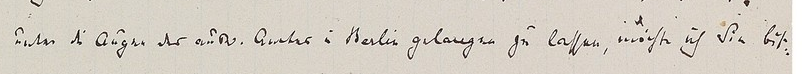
unter die Augen des ausw. Amtes in Berlin gelangen zu lassen, möchte ich Sie bit-
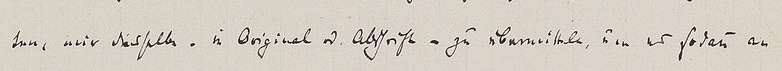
ten, mir dasselbe – in Original od. Abschrift – zu übermitteln, um es sodann an
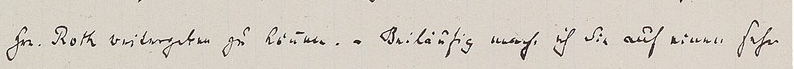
Hrn. Roth weitergeben zu können. – Beiläufig mache ich Sie auf einen sehr
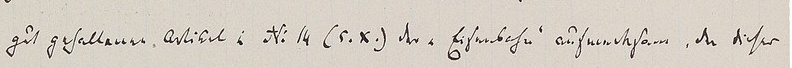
gut gehaltenen Artikel in No 14 (5. X.) der «Eisenbahn» aufmerksam, der dieses
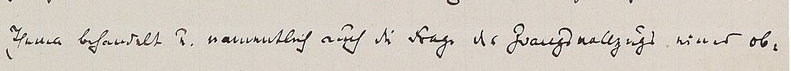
Thema behandelt u. namentlich auch die Frage des Zwangsvollzugs eines ob-
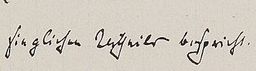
sieglichen Urtheils bespricht.
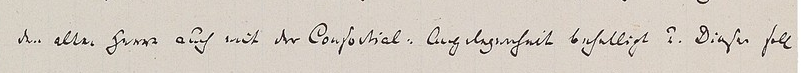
den alten Herrn auch mit der Consortial-Angelegenheit behelligt u. Dieser soll
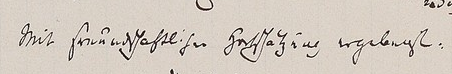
Mit freundschaftlicher Hochschätzung ergebenst:
